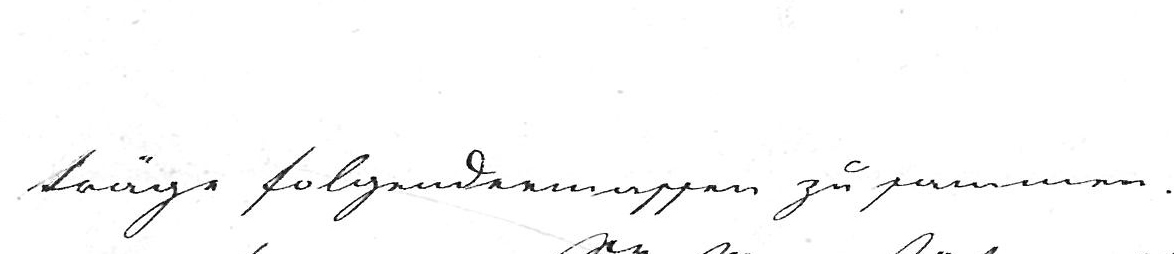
träge folgendermassen zusammen.
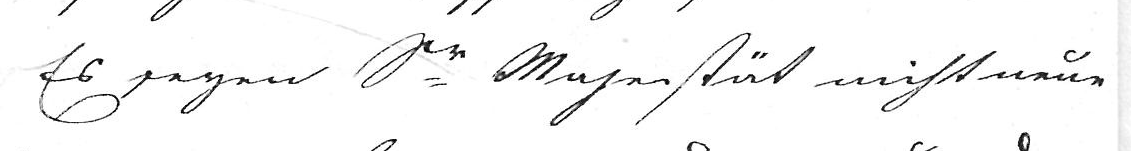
Es seyen Sr Majestät nicht neue
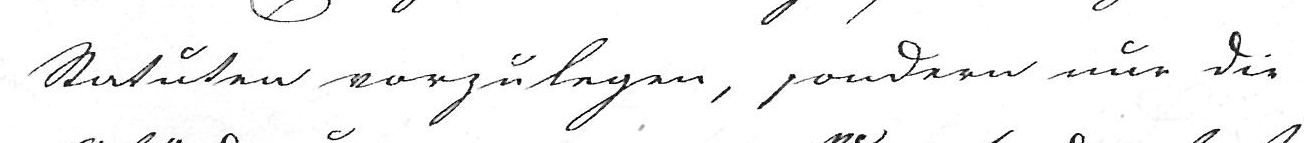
Statuten vorzulegen, sondern nur die
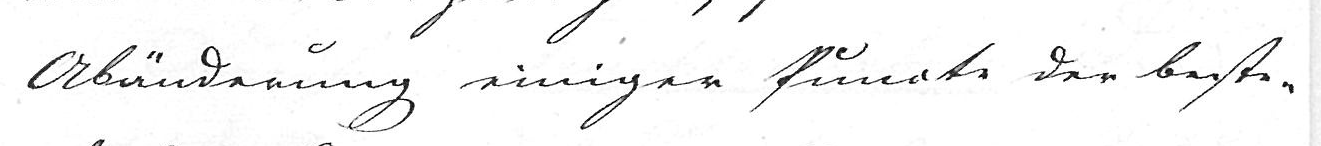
Abänderung einiger Puncte der beste-
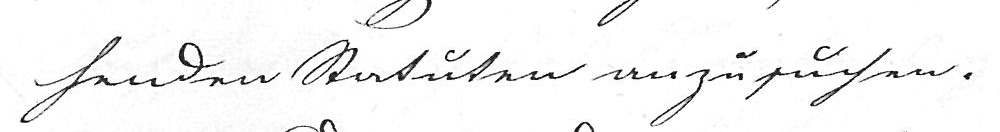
henden Statuten anzusuchen.
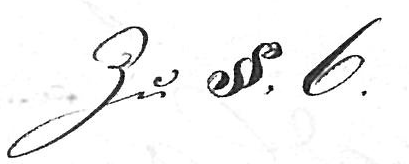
Zu §. 6.
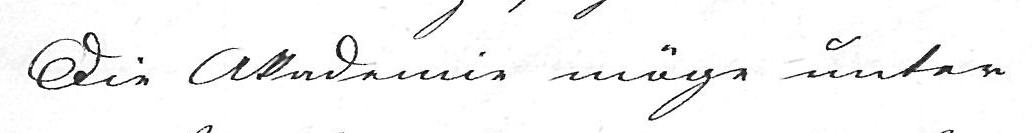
Die Akademie möge unter
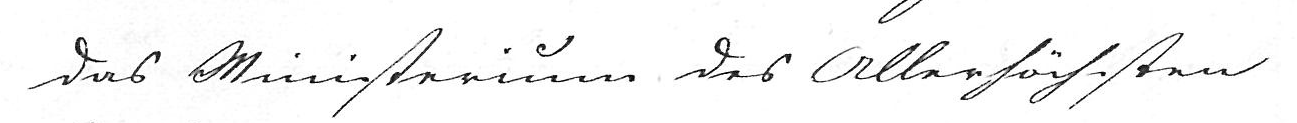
das Ministerum des Allerhöchsten
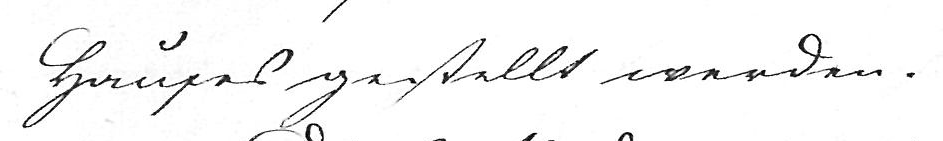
Hauses gestellt werden.
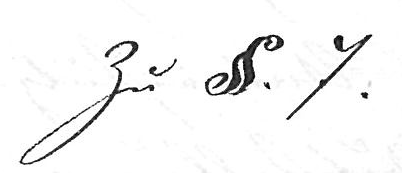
Zu §. 7.
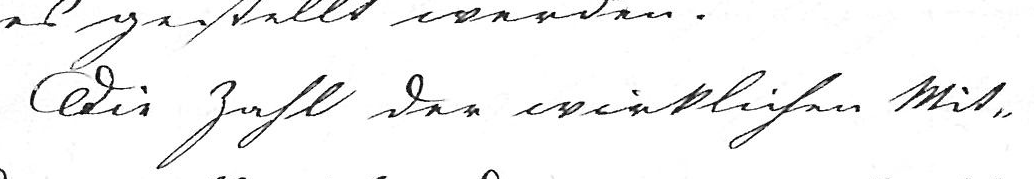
Die Zahl der wirklichen Mit-
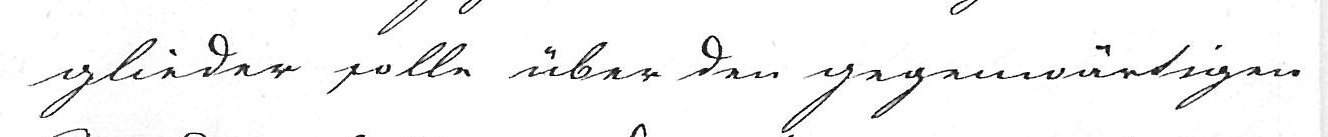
glieder solle über den gegenwärtigen
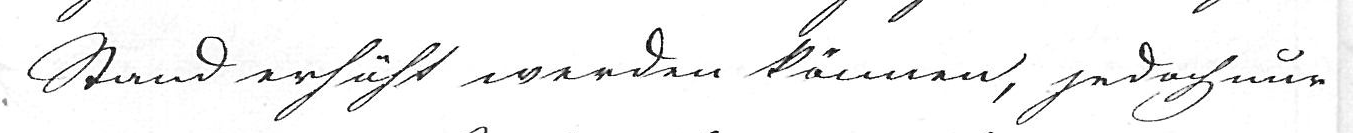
Stand erhöht werden können, jedoch nur
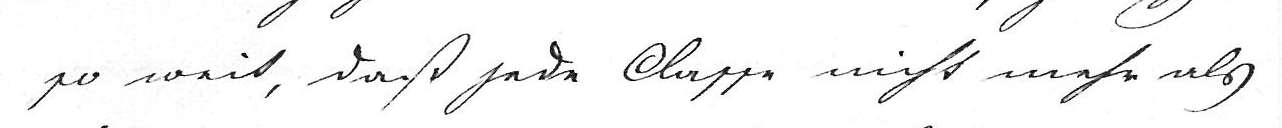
so weit, daß jede Classe nicht mehr als
